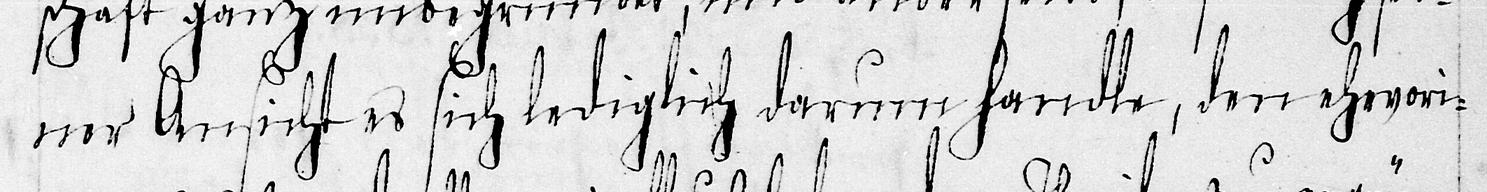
ner Ansicht es sich lediglich darum handle, den ehevori¬
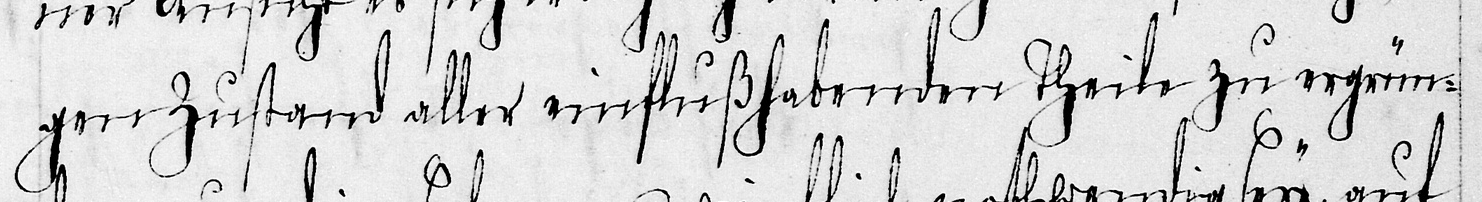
gen Zustand aller einflußhabenden Theile zu ergrün¬
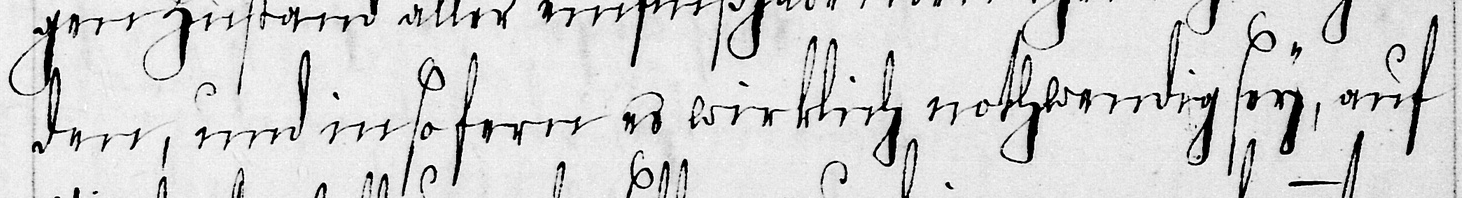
den, und in so fern es wirklich nothwendig sey, auf
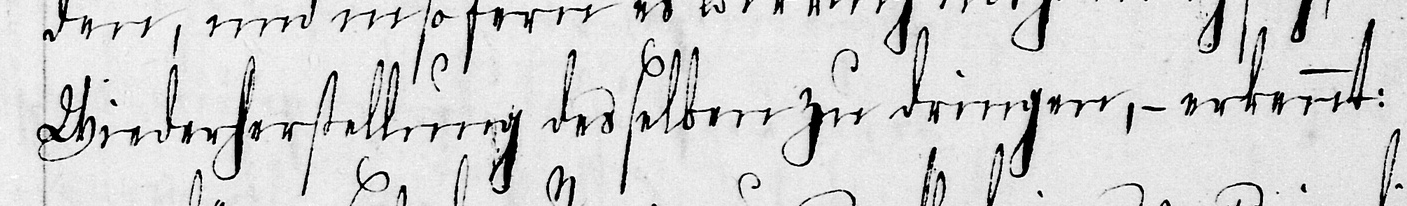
Wiederherstellung desselben zu dringen, – erkennt:
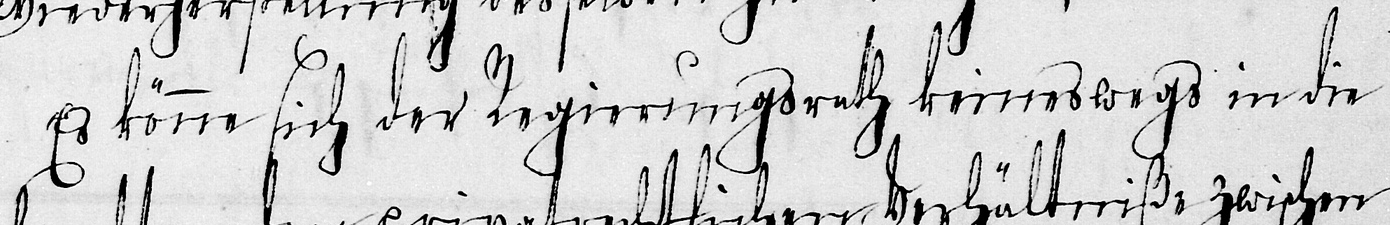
Es könne sich der Regierungsrath keineswegs in die
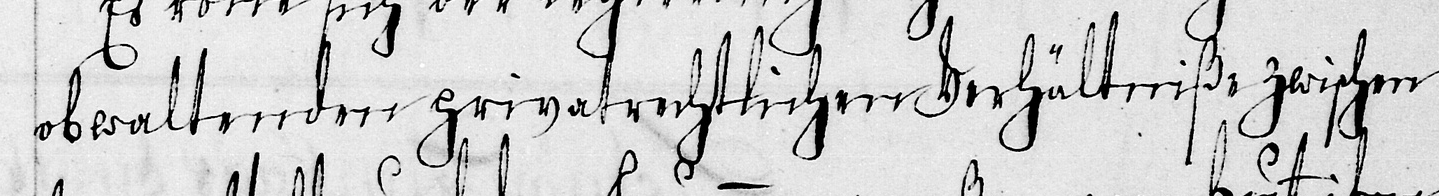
obwaltenden privatrechtlichen Verhältniße zwischen
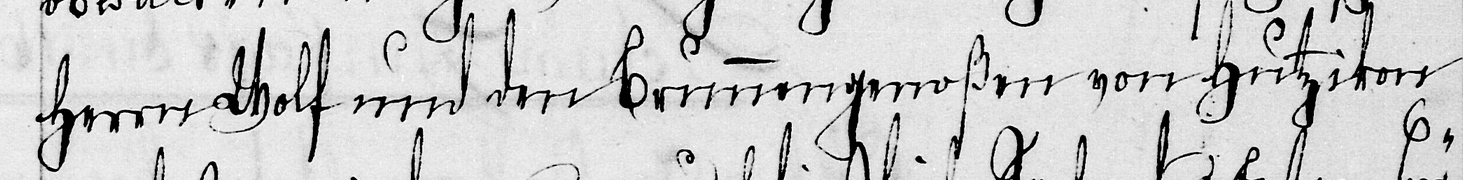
Herrn Wolf und den Brunnengenoßen von Hutzikon
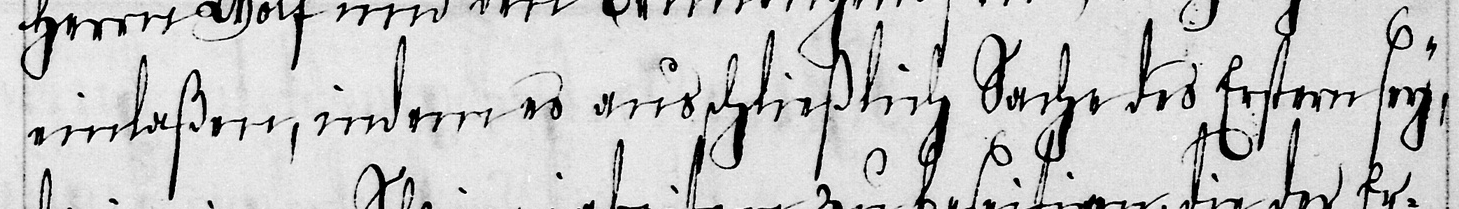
einlaßen, indem es ausschließlich Sache des Erstern
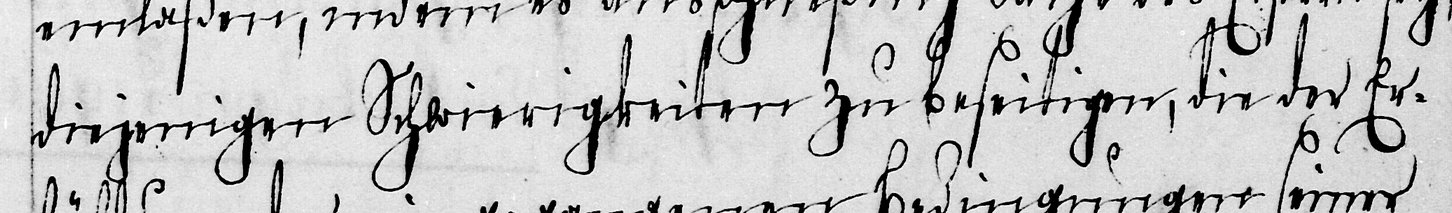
diejenigen Schwierigkeiten zu beseitigen, die der Er¬
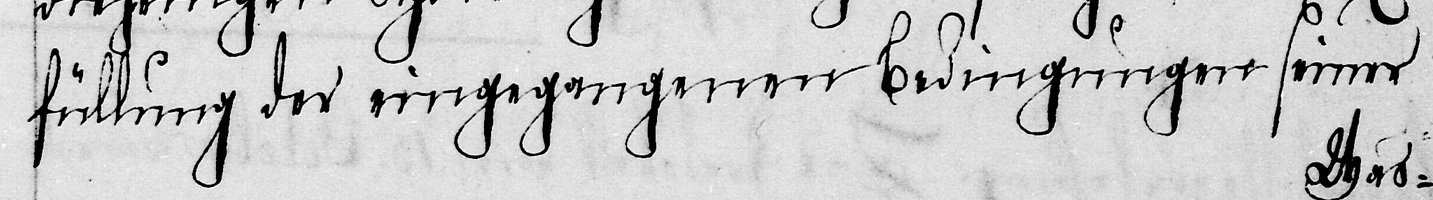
füllung der eingegangenen Bedingungen seiner
